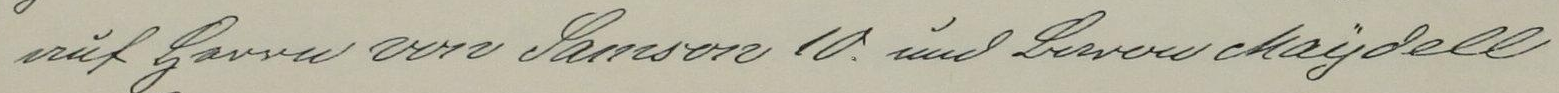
auf Herrn von Samson 10. und Baron Maydell
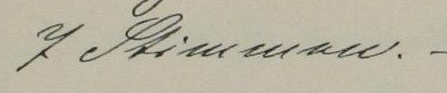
7 Stimmen.
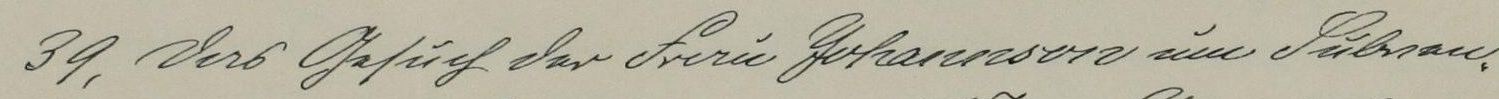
39. Das Gesuch der Frau Johannson um Subven-
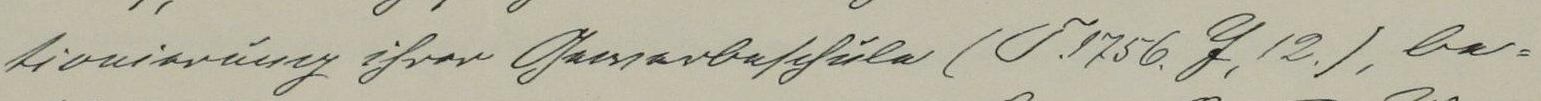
tionierung ihrer Gewerbeschule (T.1756; J.12), be-
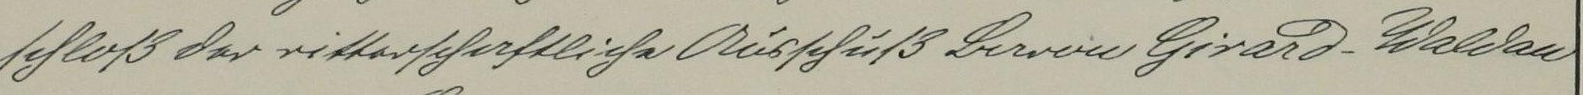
schloß der ritterschaftliche Ausschuß Baron Girard-Waldau
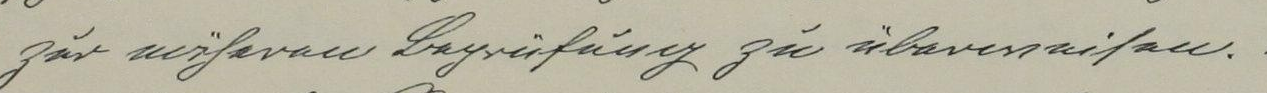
zur näheren Beprüfung zu überweisen.
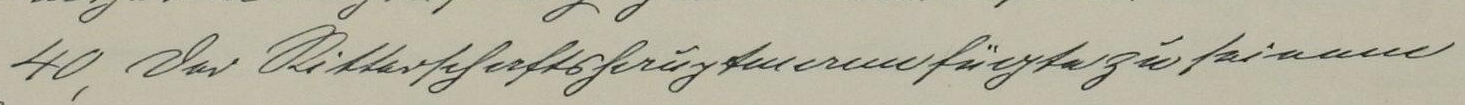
40. Der Ritterschaftshauptmann fügte zu seinem
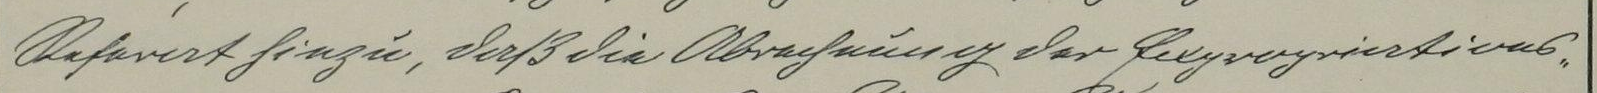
Referat hinzu, daß die Abrechnung der Expropriations-
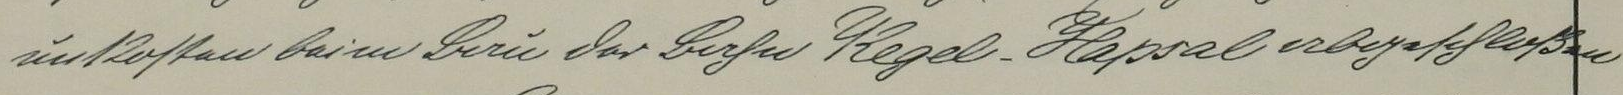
unkosten beim Bau der Bahn Kegel-Hapsal abgeschloßen
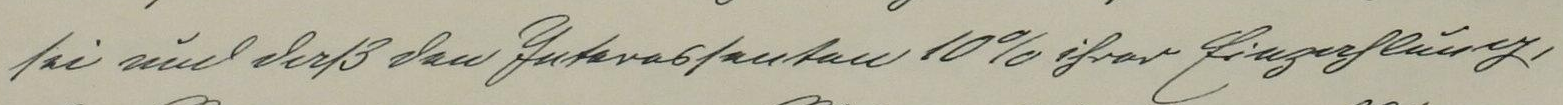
sei und daß den Interessenten 10% ihrer Einzahlung,
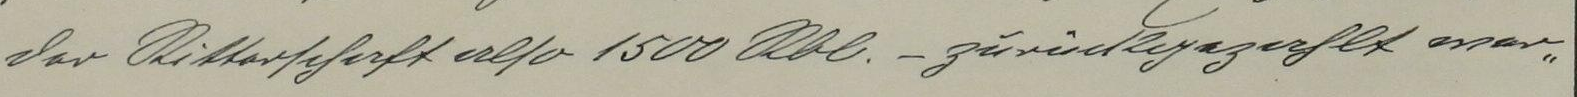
der Ritterschaft also 1500 Rbl. - zurückgezahlt wer-
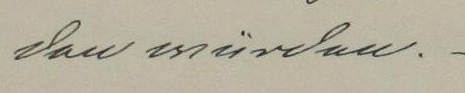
den würden.
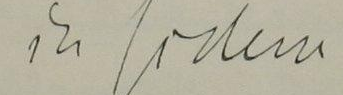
in fidem
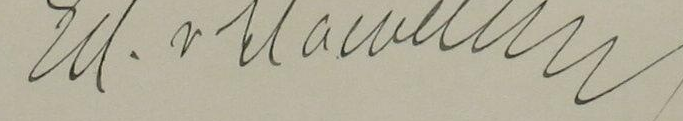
Ed. v. Stackelberg
